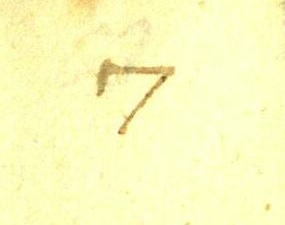7
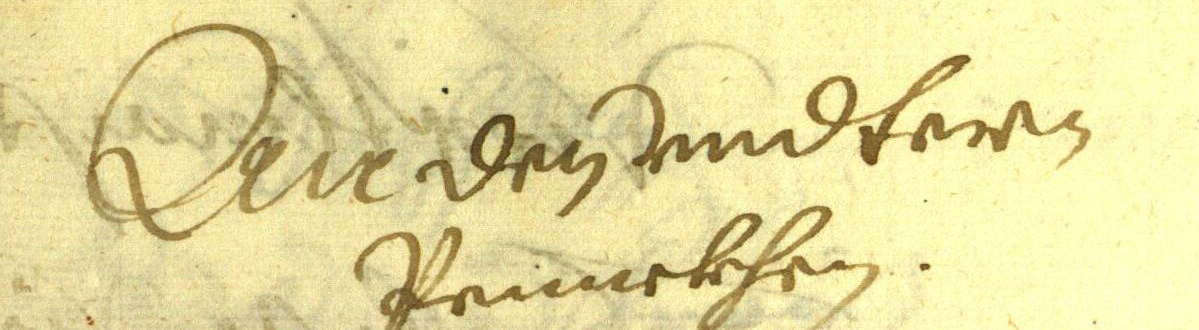An den vndtern
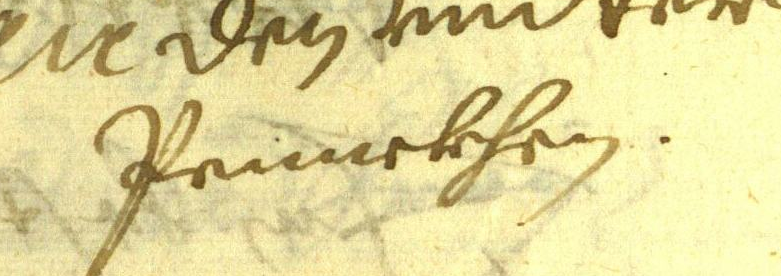Pennckhen.
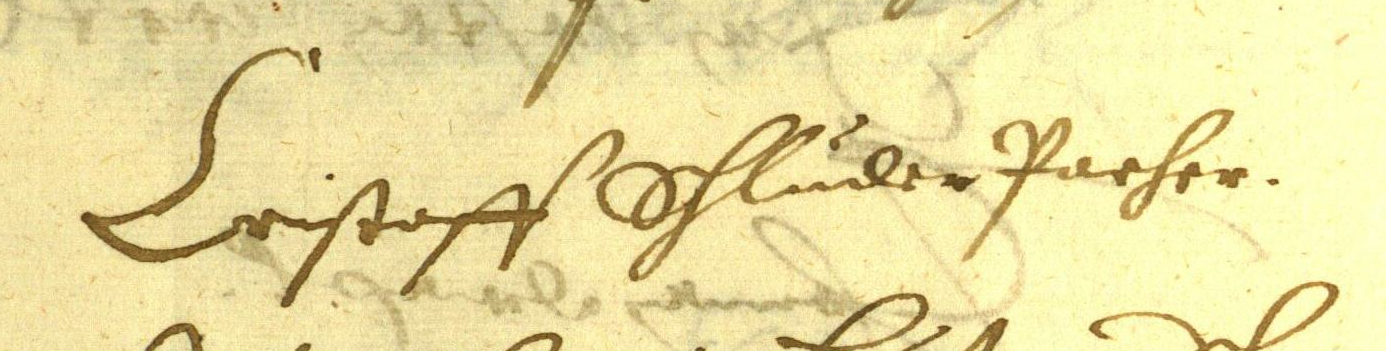Cristoff Schlūder Pacher.
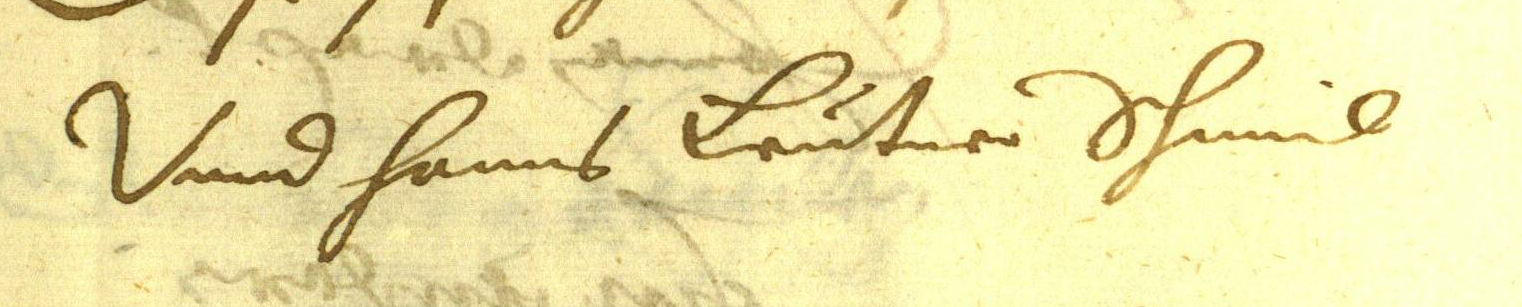Vnd hanns Leūtner Schmid
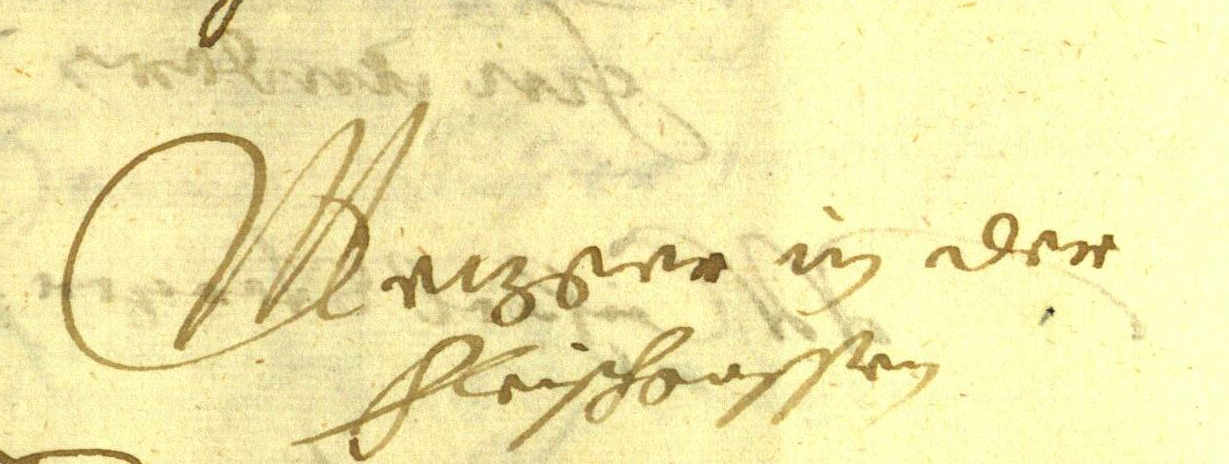Mezger in der
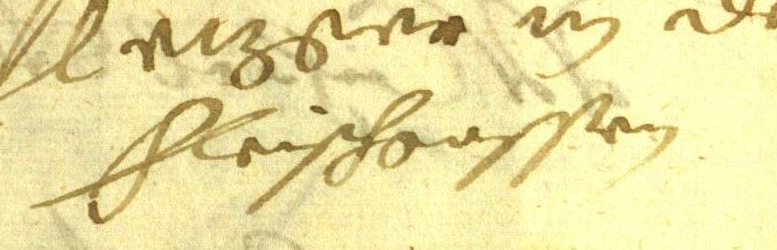Fleischgassen
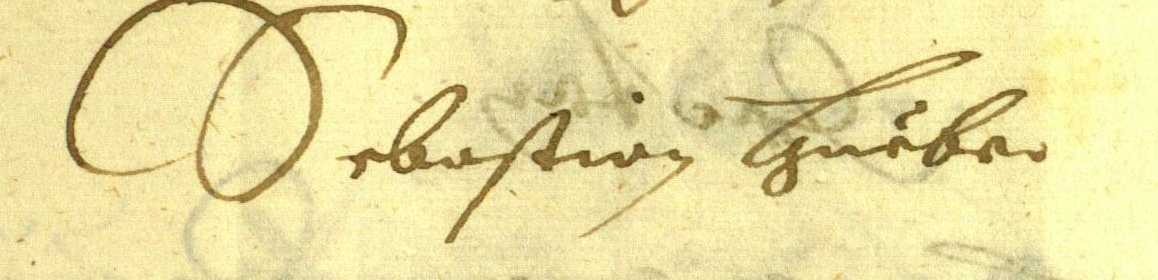Sebastian Hūeber
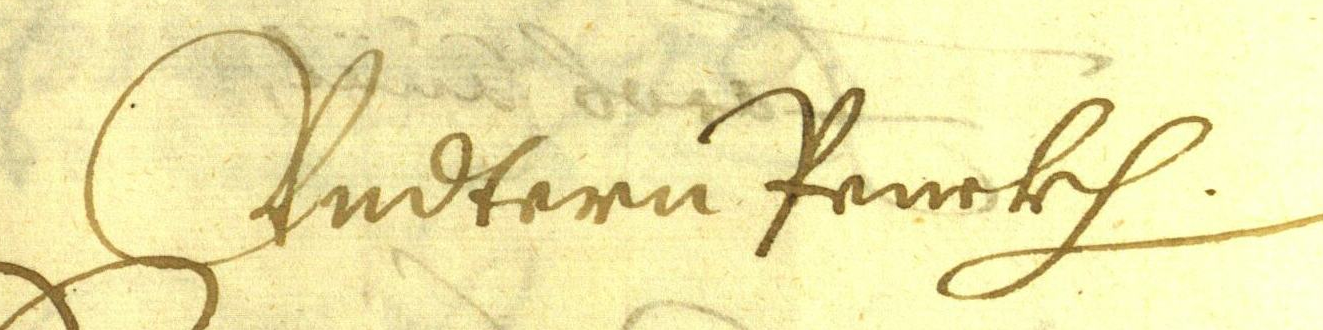Vndtern Penckh.
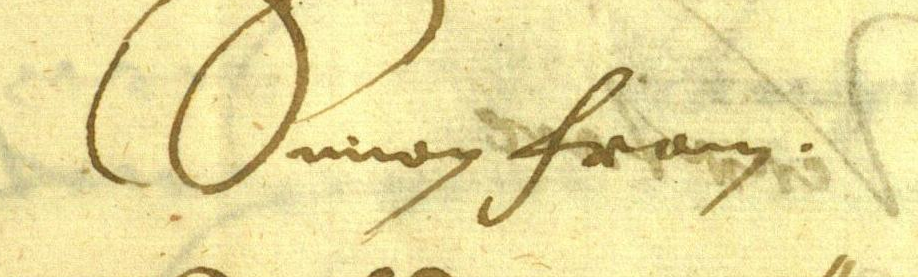Simon From.
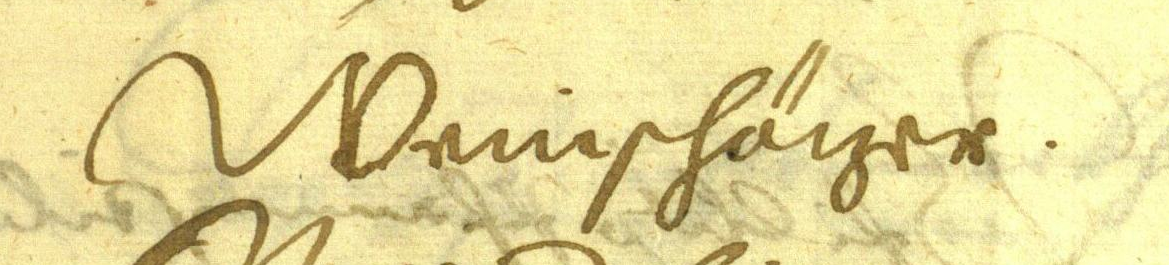Weinschäzer.
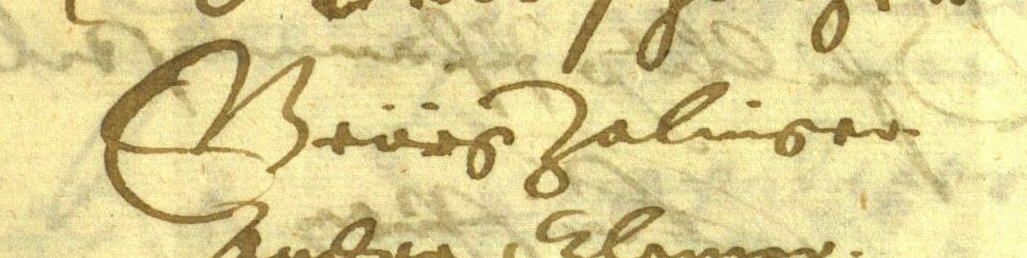Geörg Zalinger.
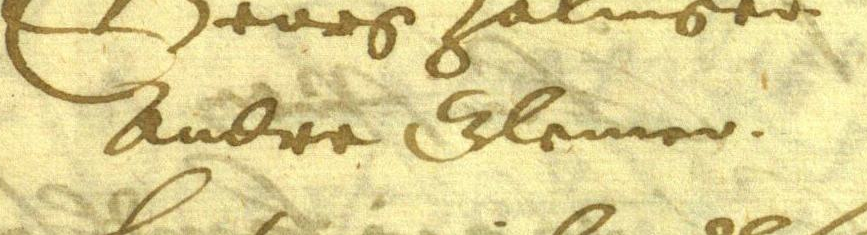Andre Glemer.
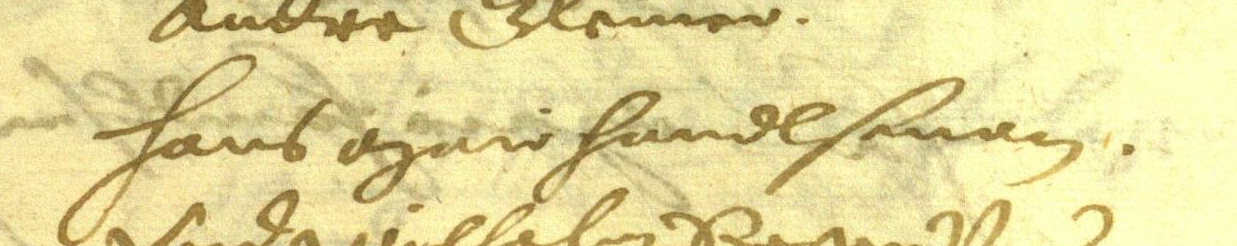hans Mair handlsman.
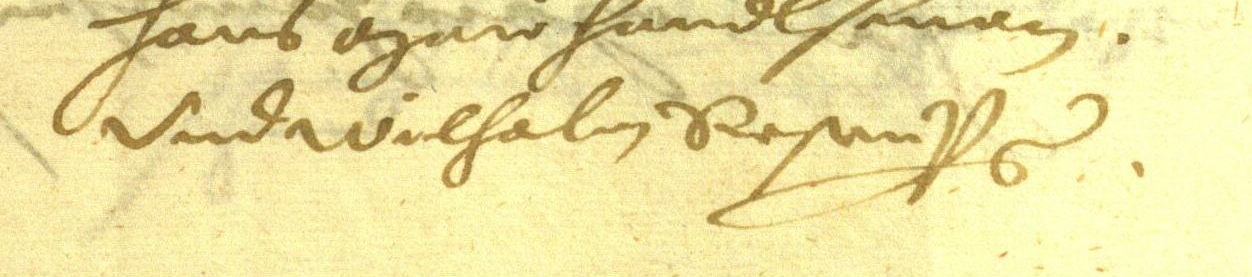Vnd Wilhalm ResenP.
